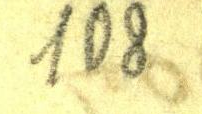108
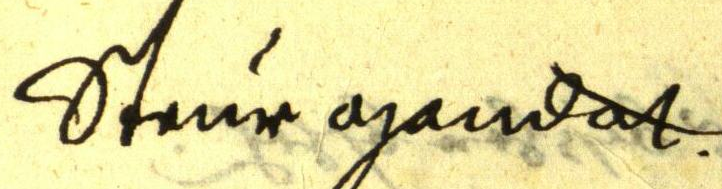Steūr Mandat.
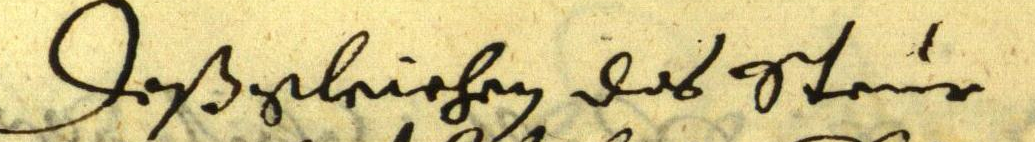Deßgleichen des Steūr
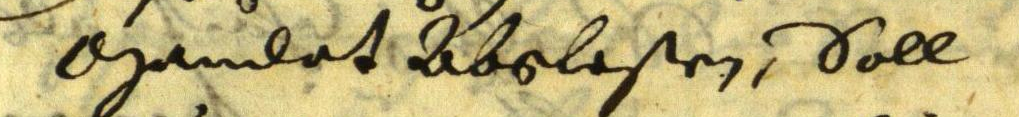Mandat Abglesen, Soll
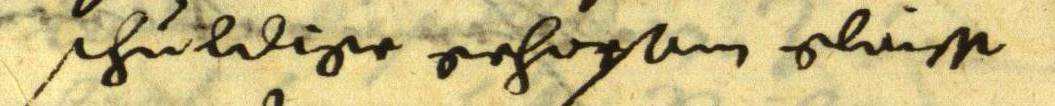schūldige gehorsam glaisst
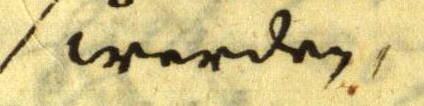werden,
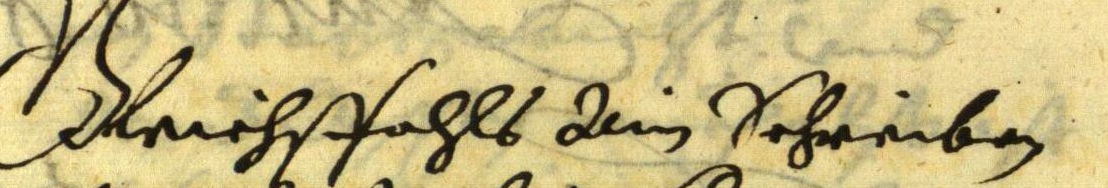Gleichsfahls Ain Schreiben
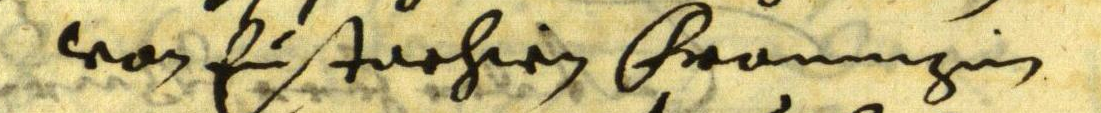von Eūstachen Frannzin
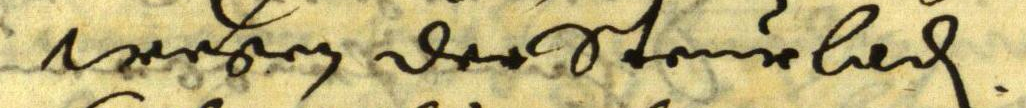wegen der Steūr lad.
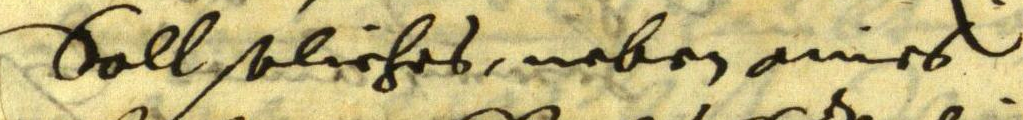Soll soliches, neben aines
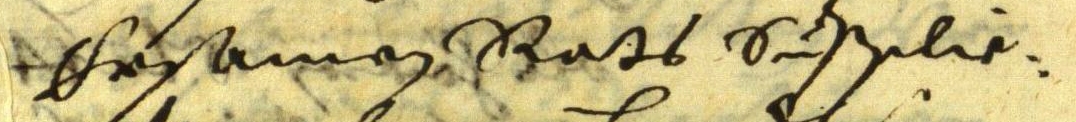Ersamen Rats SūPplic¬
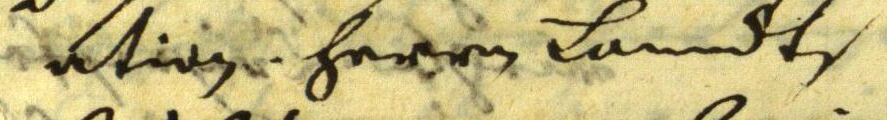ation herrn Lanndts¬
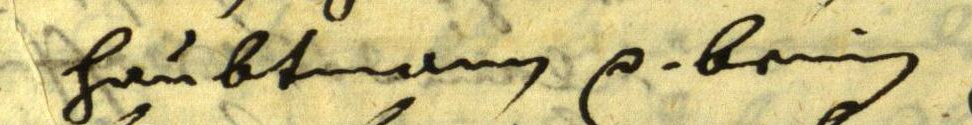haūbtmann etc. beim
